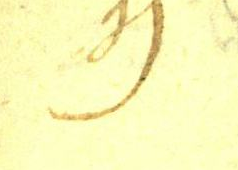11
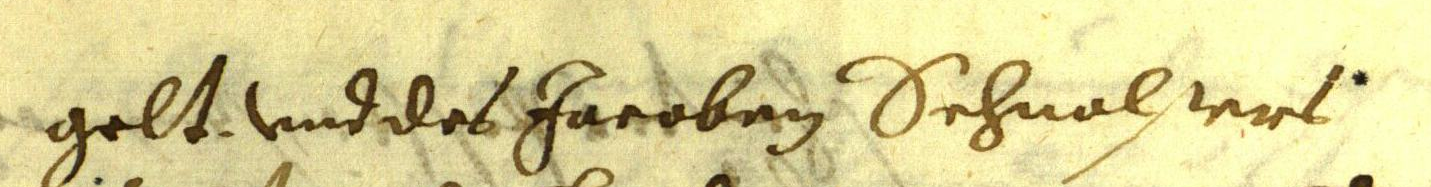gelt. vnd des Jacoben Schnalsers
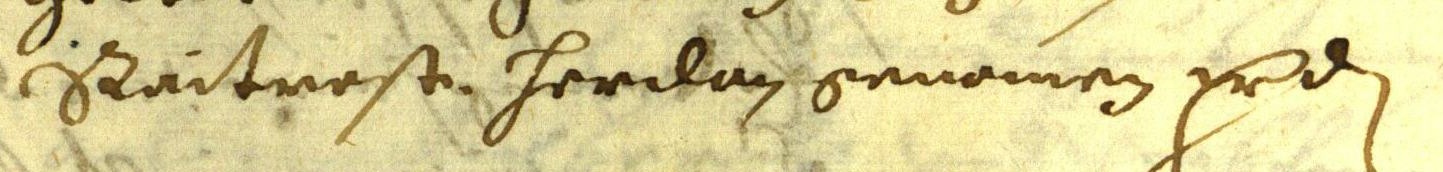Raitrest. herdan genomen wd
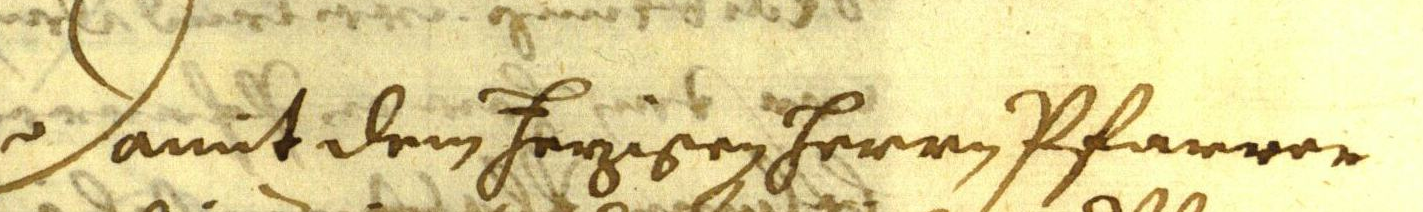Damit dem Jezigen herrn Pfarrer
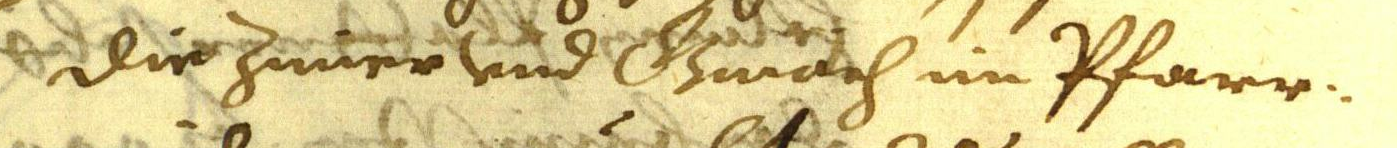Die Zimer vnd Gmach im Pfarr¬
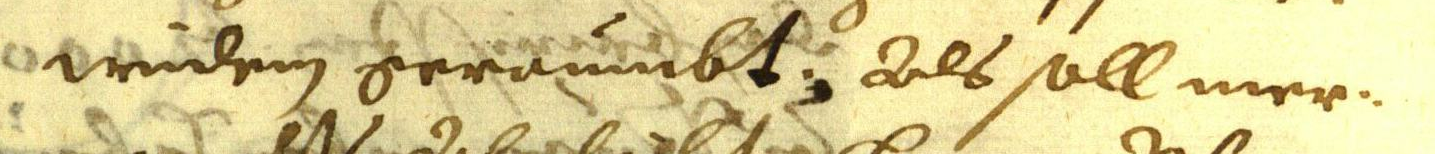widum geraūmbt, als soll mer¬
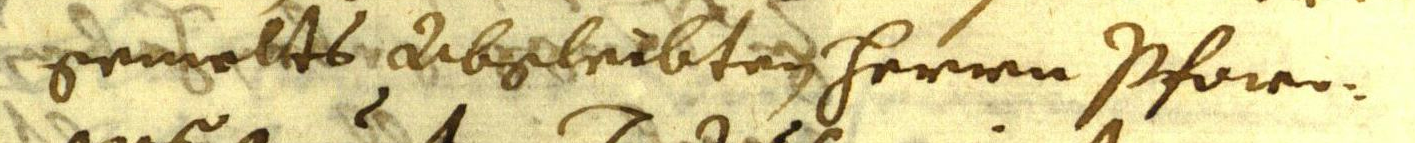gemelts abgeleibten Herrn Pfarr¬
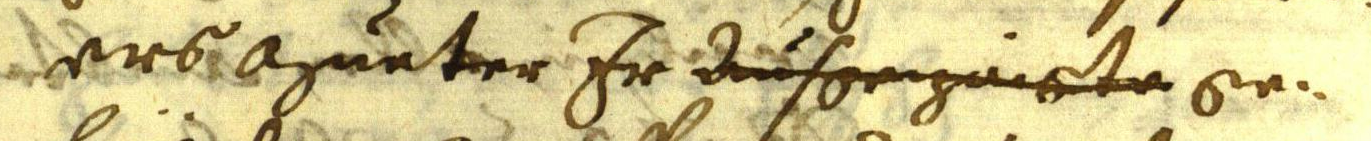ers Mūeter ir Aūsgezaigte ge¬
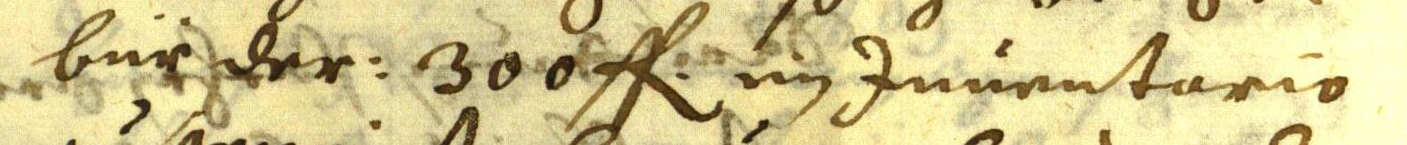bür der: 300 fl. im Inūentario
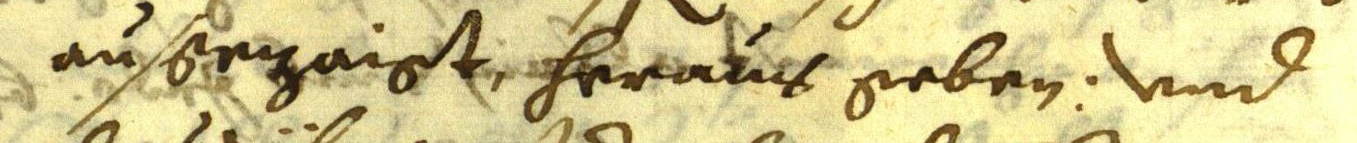aūsgezaigt, heraūs geben. vnd
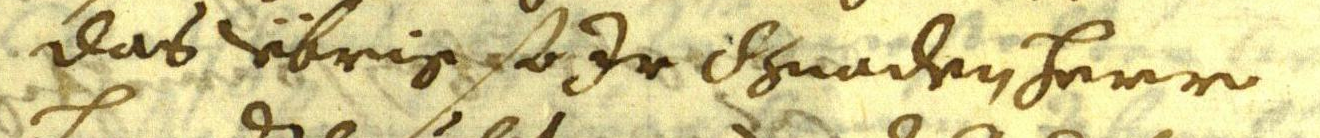das v̈brig so ir Gnaden herr
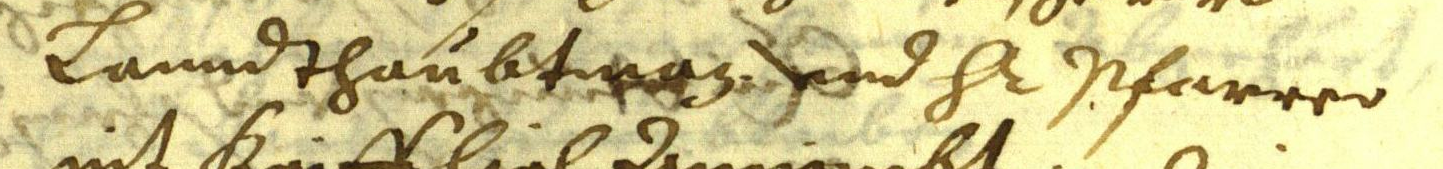Lanndthaūbtman. vnd h Pfarrer
